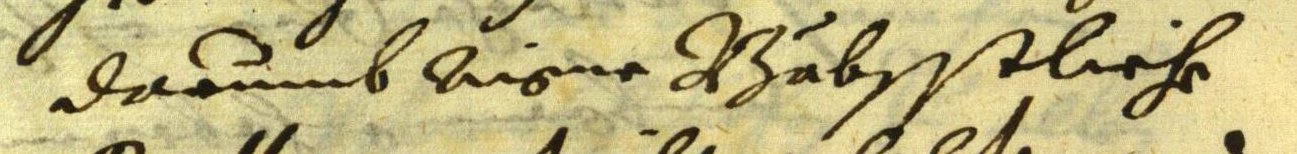darūmb Aigne Bäbsstliche
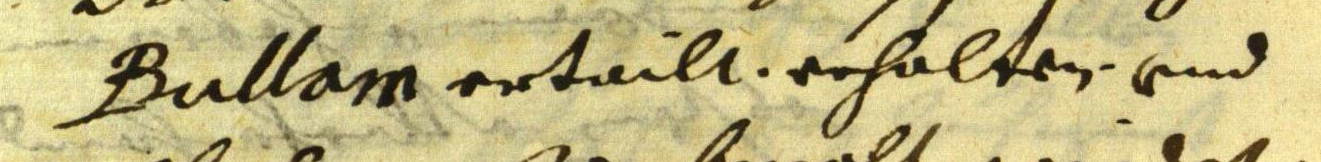Bullam ertailt. erhalten. vnd
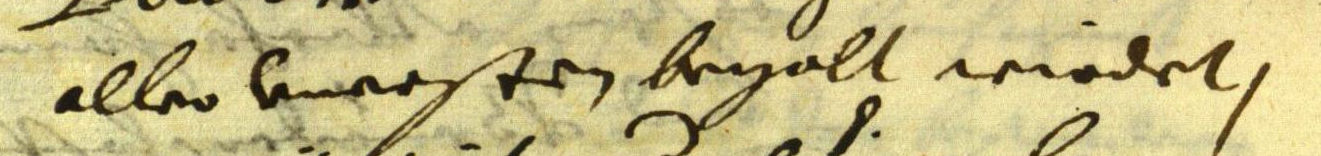aller vncosten bezalt wirdet,
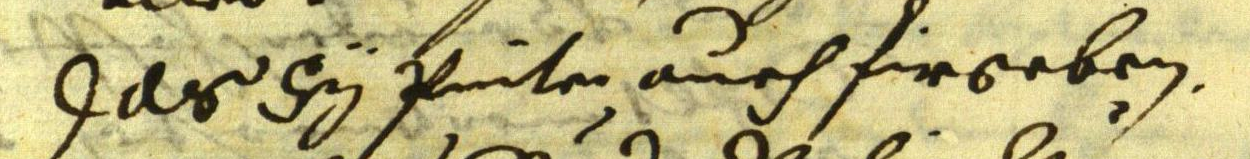Das Sÿ Pinter aūch firgeben.
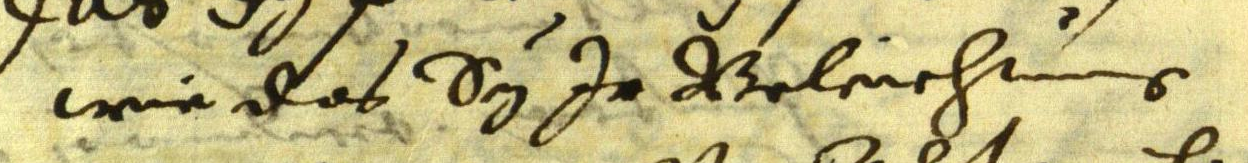wie das Sȳ Ir Beleichtūng
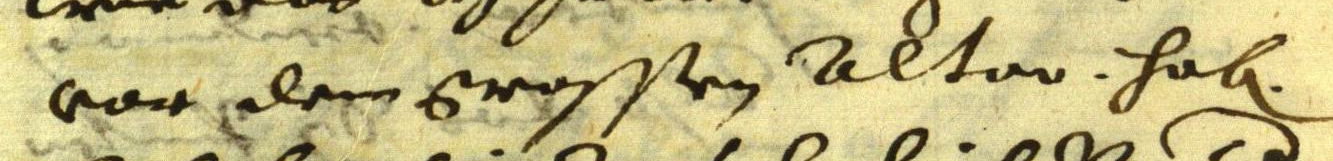vor dem grossen Altar. hab.
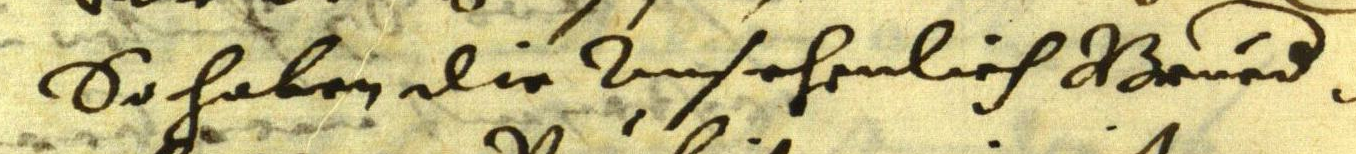So haben die Ansehenlich Brūed¬
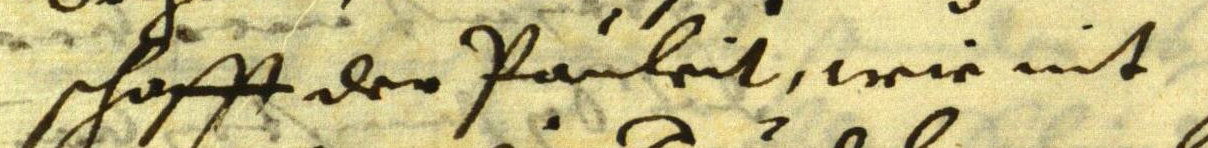schafft der Paūleit, wie nit
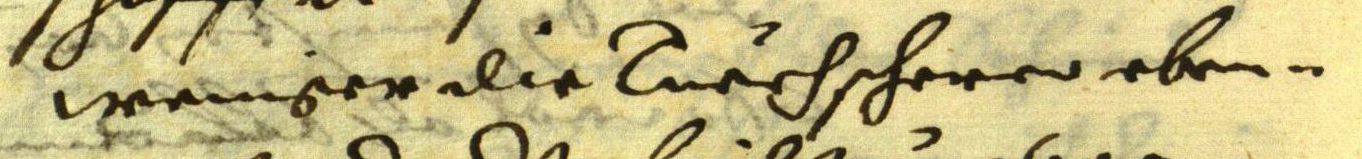weniger die Tūechscherer eben¬
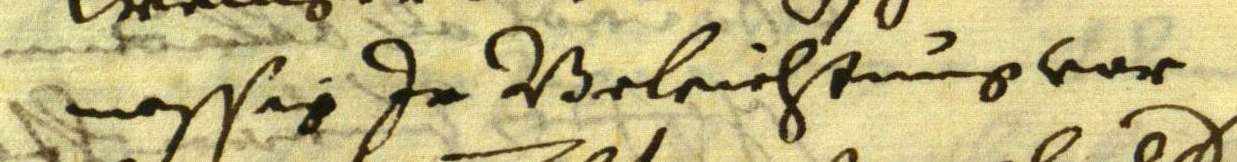messig Ir Beleichtūng vor
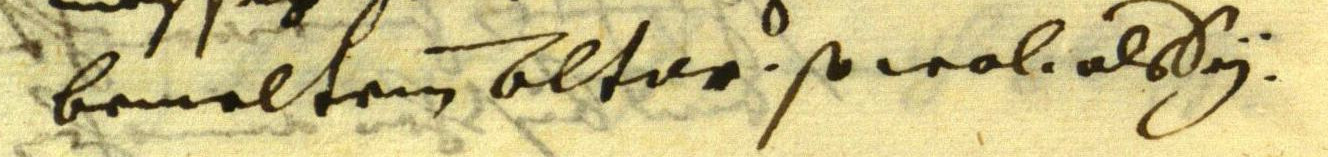bemeltem Altar. so wol. als Sÿ.
